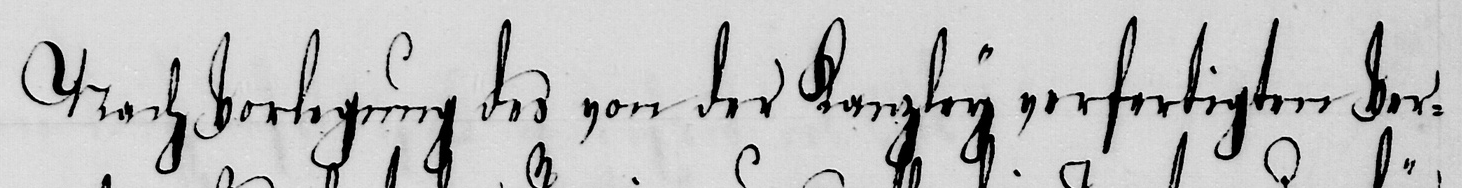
Nach Vorlegung des von der Kanzley verfertigten Ver¬
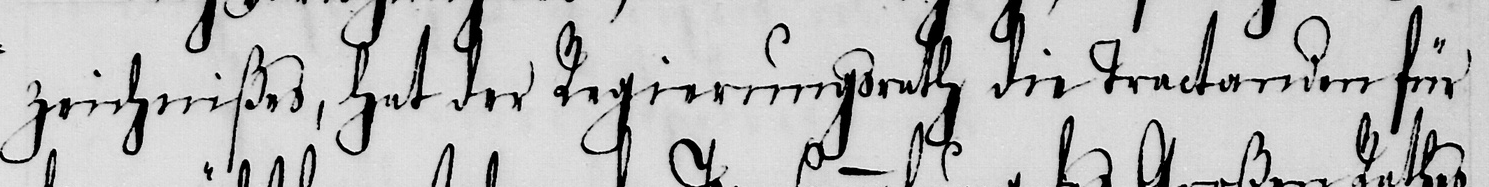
zeichnißes, hat der Regierungsrath die Tractanden für
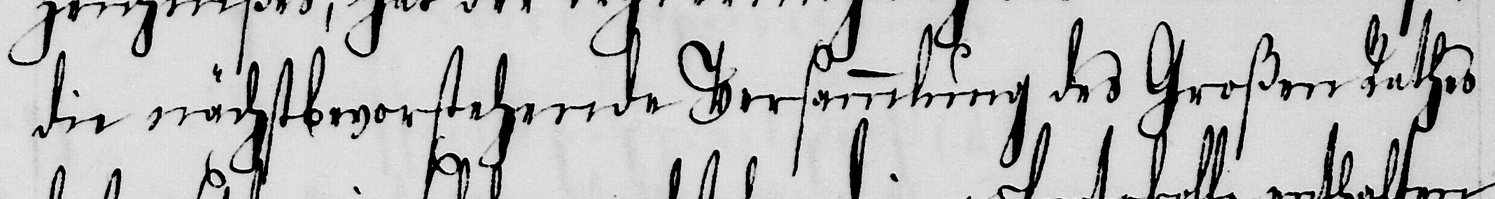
die nächstbevorstehende Versammlung des Großen Rathes
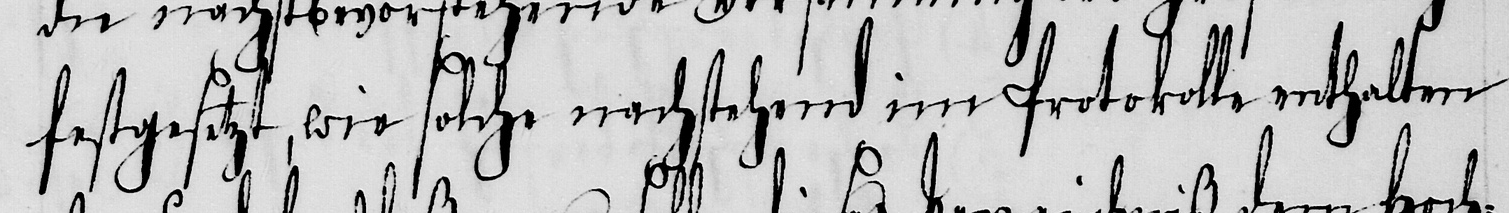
festgesetzt, wie solche nachstehend im Protokolle enthalten
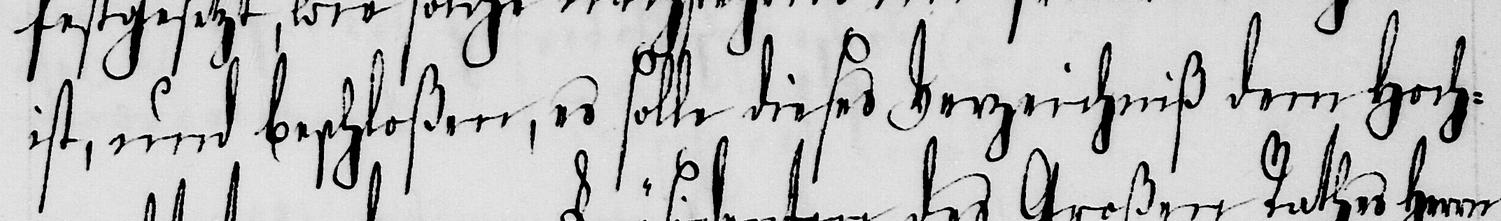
ist, und beschloßen, es solle dieses Verzeichniß dem Hoch¬
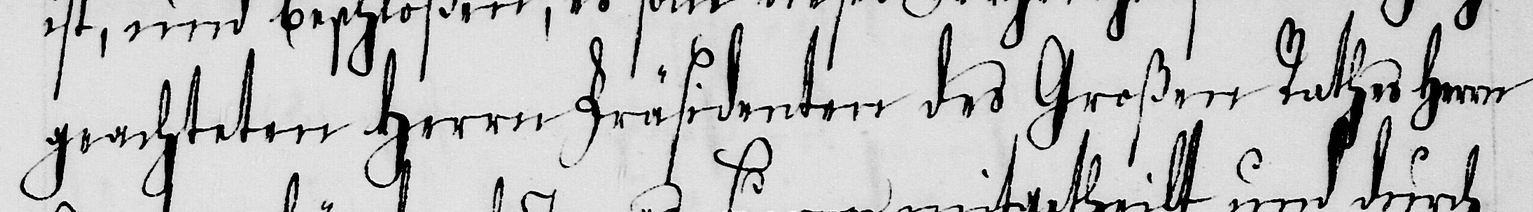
geachteten Herrn Präsidenten des Großen Rathes Her¬
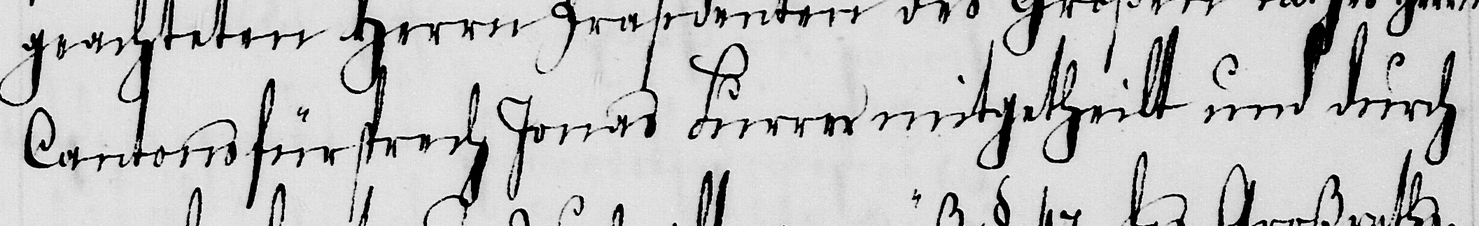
Cantonsfürsprech Jonas Furrer mitgetheilt und durch
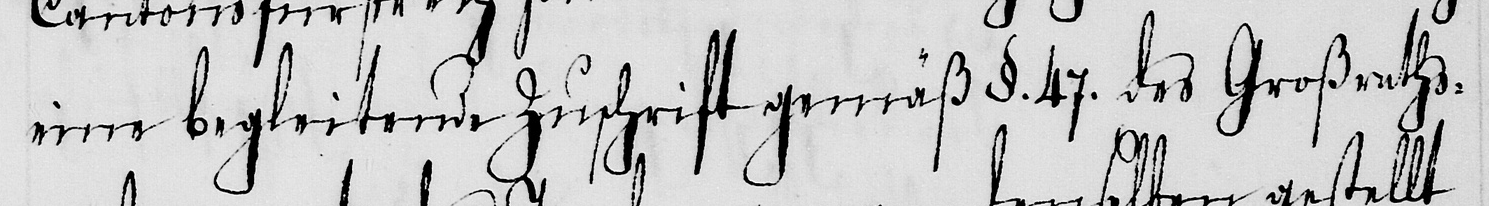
eine begleitende Zuschrift gemäß §. 47. des Großraths¬
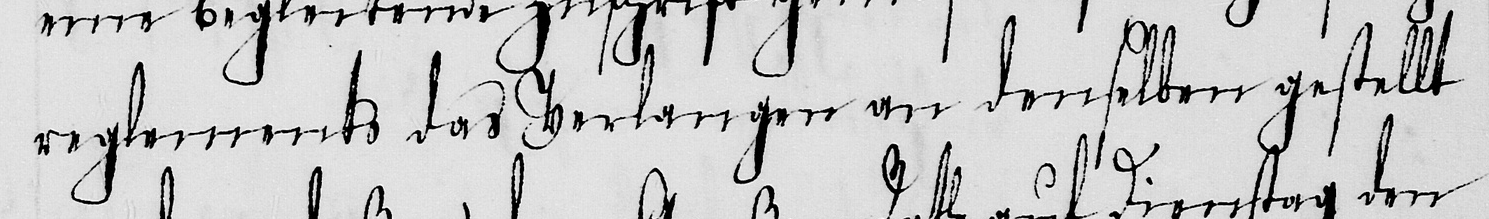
reglements das Verlangen an denselben gestellt
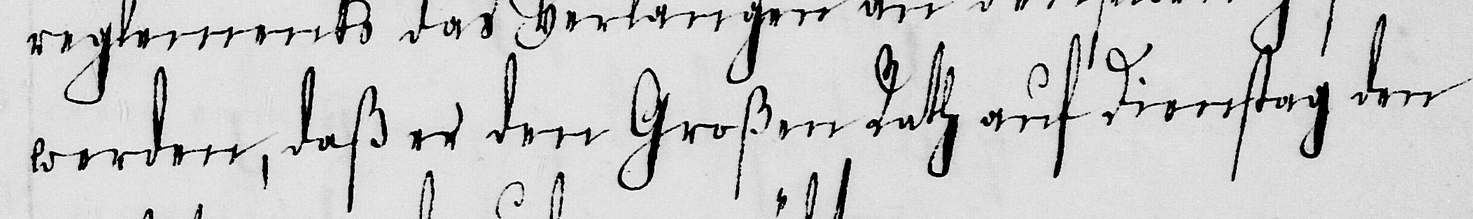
werden, daß er den Großen Rath auf Dienstag den
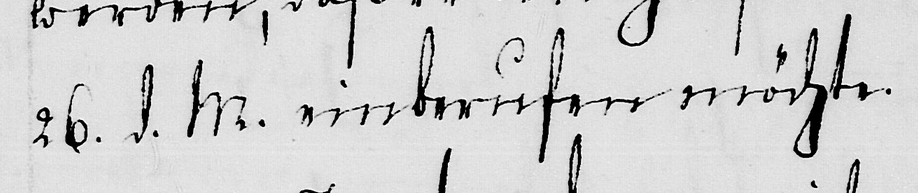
26. d. M. einberufen möchte.
